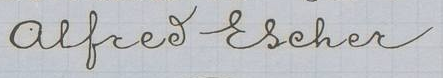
Alfred Escher
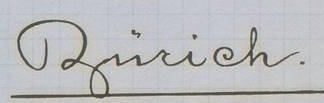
Zürich.
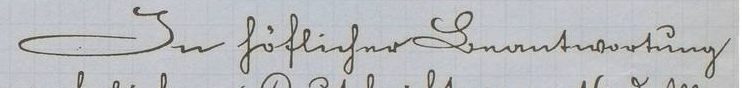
In höflicher Beantwortung
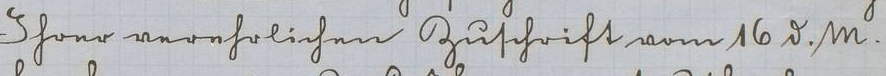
Ihrer verehrlichen Zuschrift vom 16 d. M.
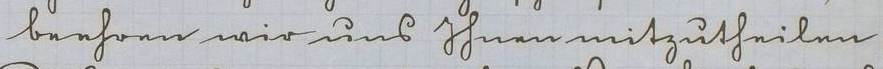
beehren wir uns Ihnen mitzutheilen,
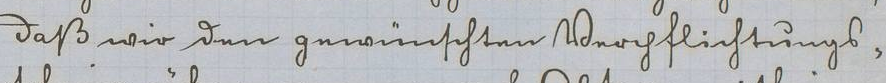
daß wir den gewünschten Verpflichtungs-
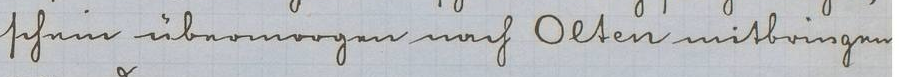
schein übermorgen nach Olten mitbringen
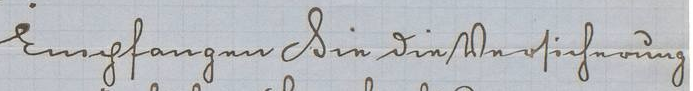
Empfangen Sie die Versicherung
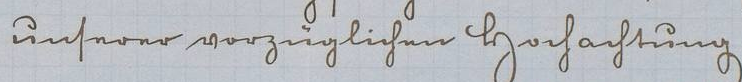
unserer vorzüglichen Hochachtung
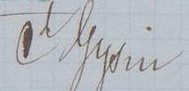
Cd Gysin
